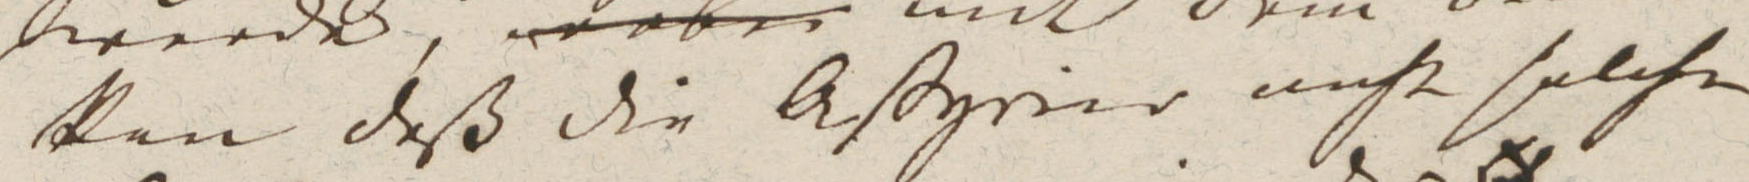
ken dass die Assyrier nicht solche
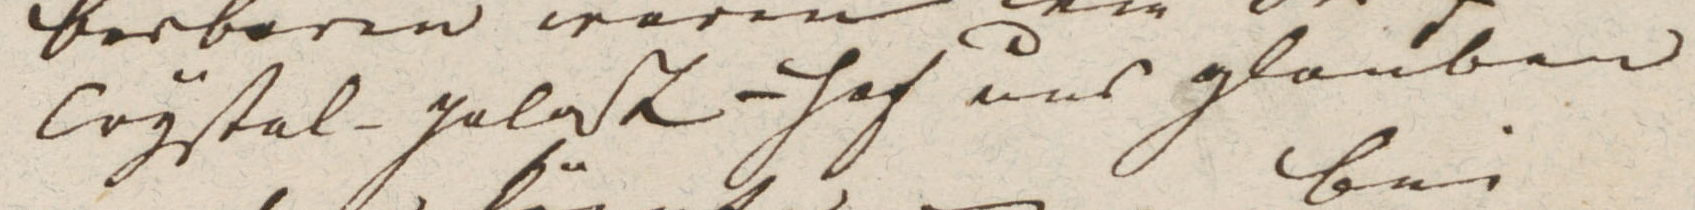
Crystal-palast-Hof uns glauben
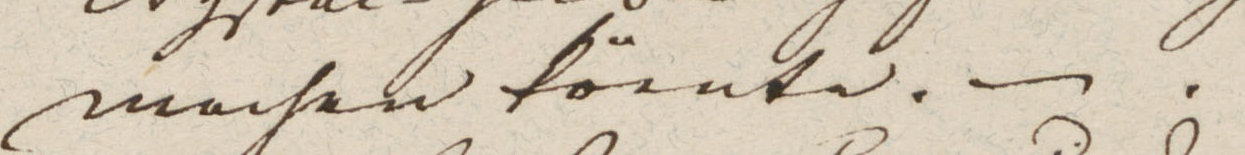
machen könnte. – .
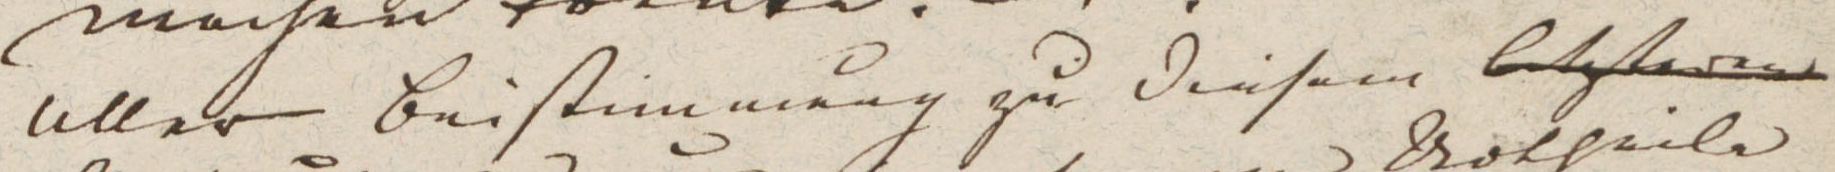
aller Beistimmung zu diesem letzteren
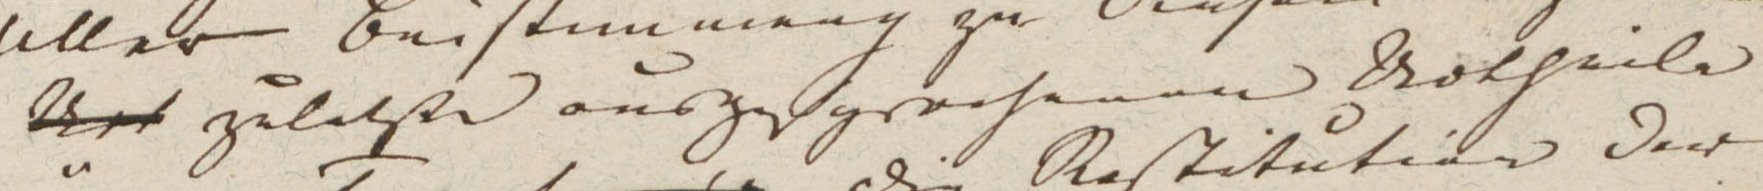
Urt zuletzt ausgesprochenen Urtheile
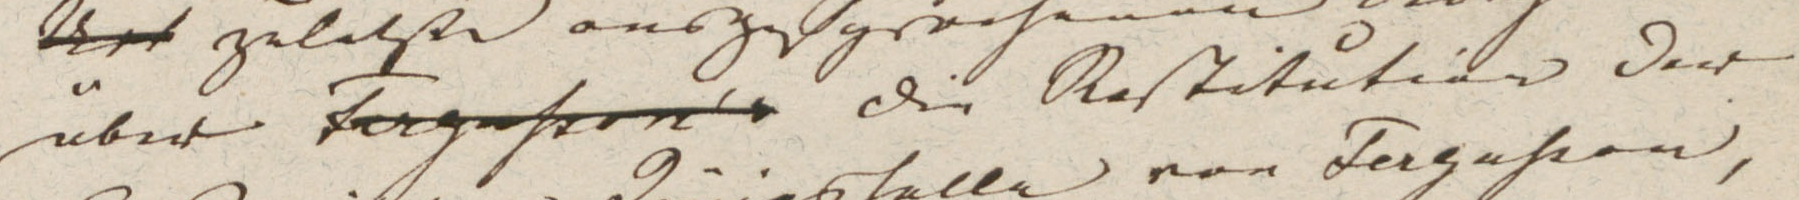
über Fergusson's die Restitution der
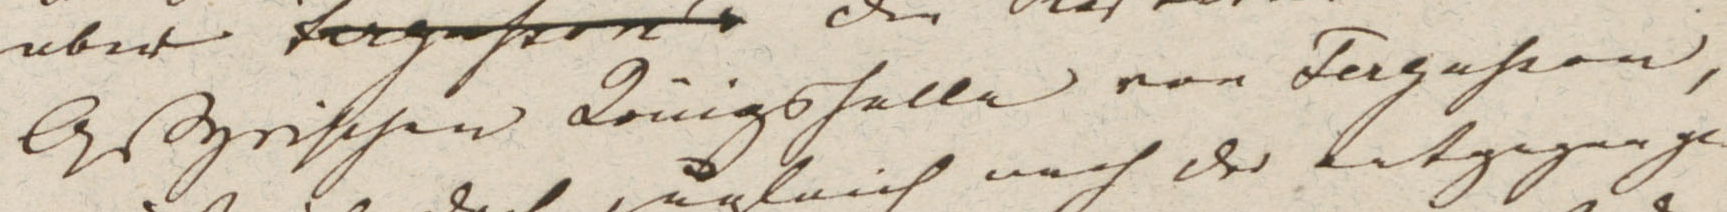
Assyrischen Königshalle von Fergusson,
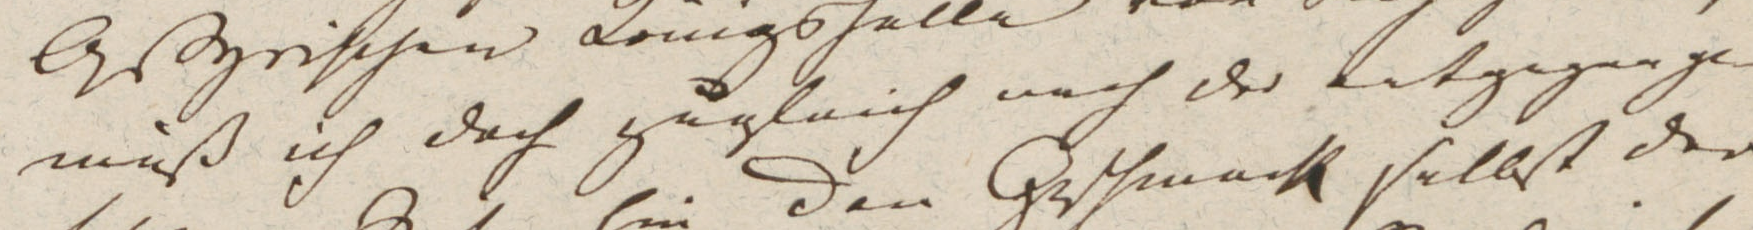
muss ich doch zugleich nach der entgegenge-
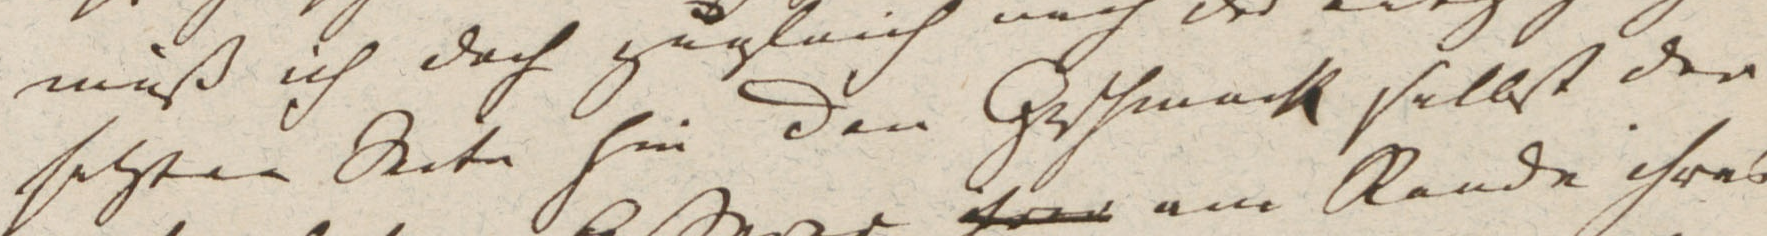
setzten Seite hin den Geschmack selbst der
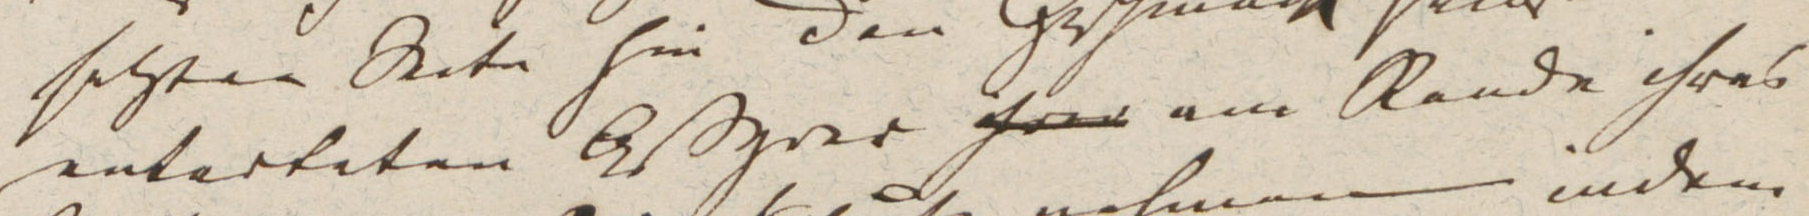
entarteten Assyrer ihrer am Rande ihres
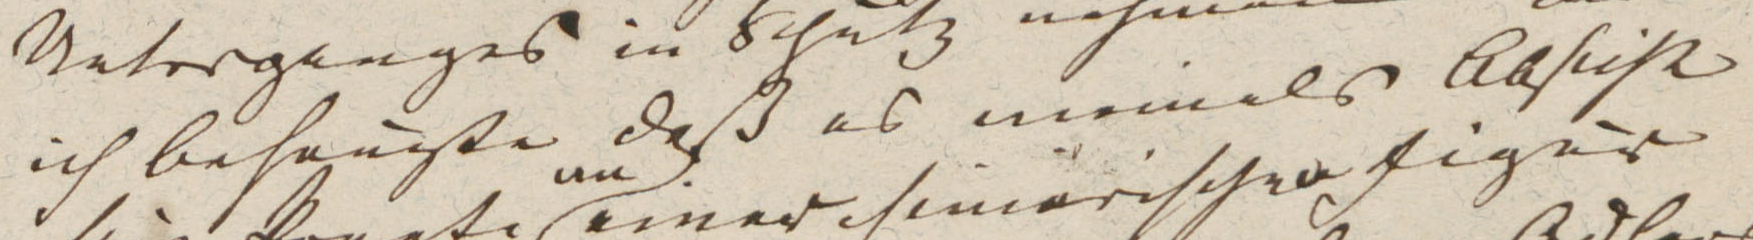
ich behaupte dass es niemals Absicht
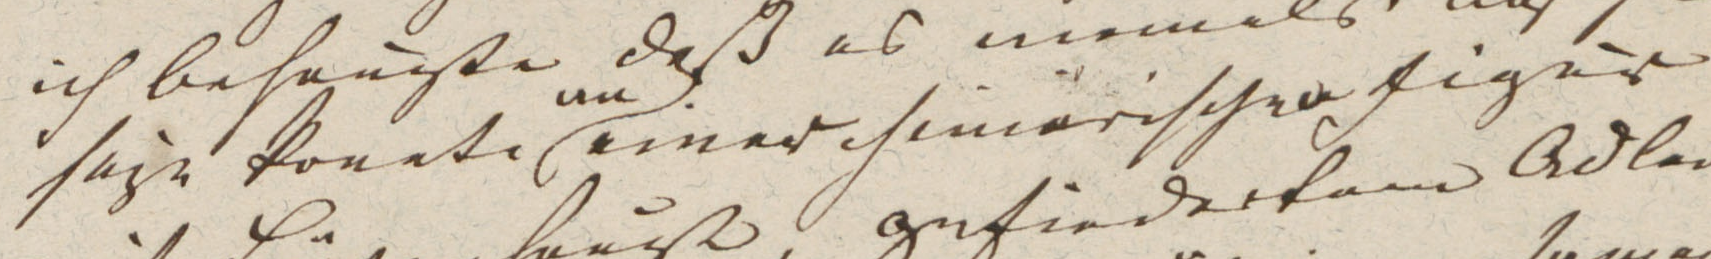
seyn konnte an einer chimärischen Figur
